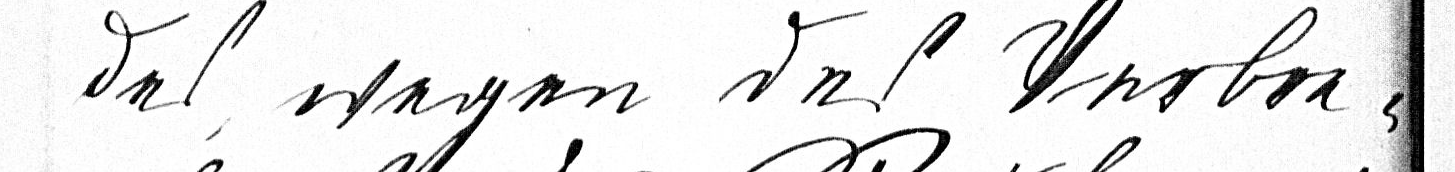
des wegen des Verbre¬
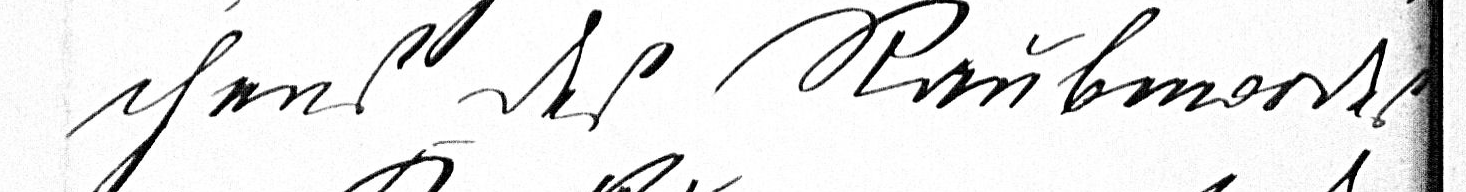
chens des Raubmordes
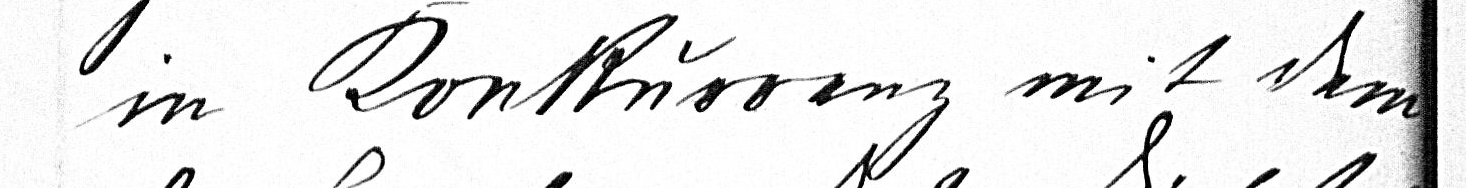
in Konkurrenz mit dem
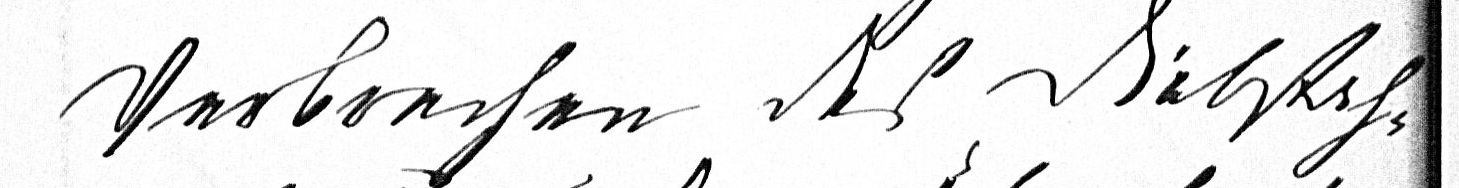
Verbrechen des Diebstah¬
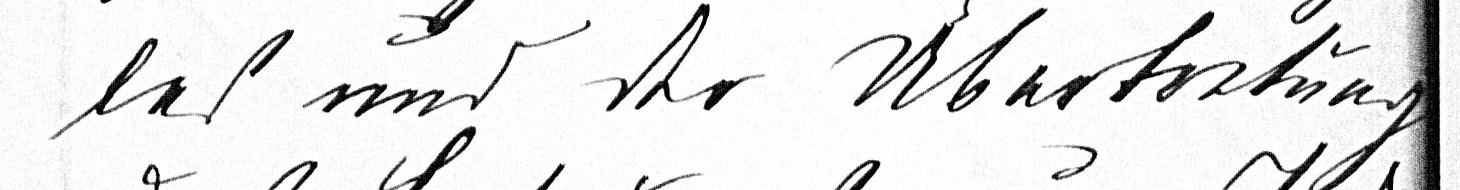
les und der Übertretung
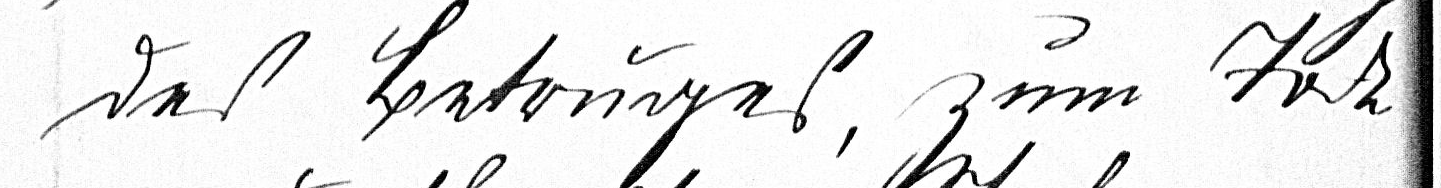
des Betruges, zum Tode
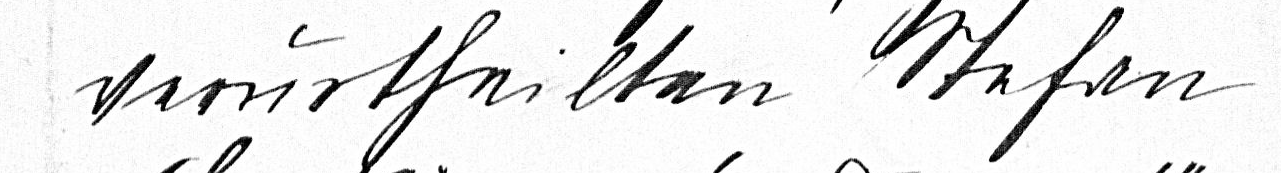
verurtheilten Stefan
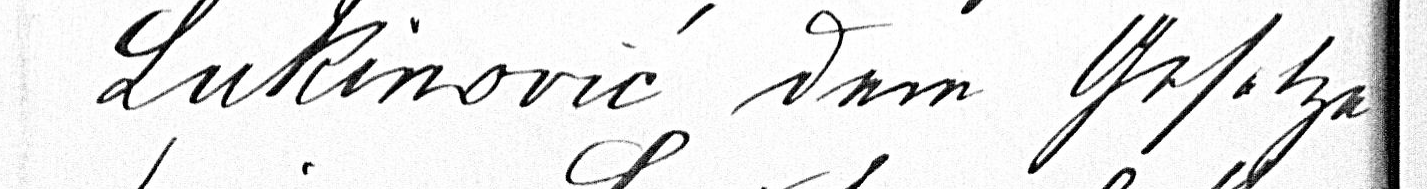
Lukinović dem Gesetze
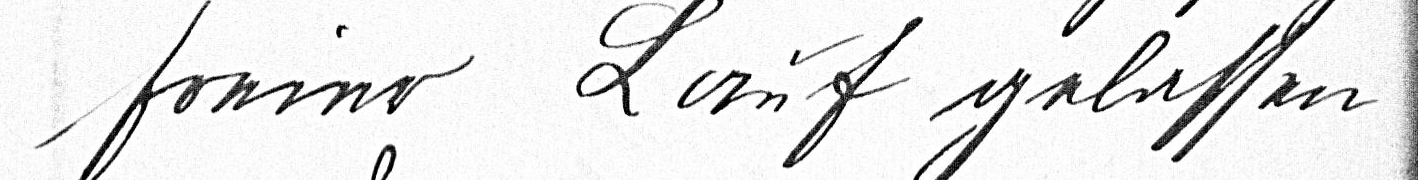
freier Lauf gelassen
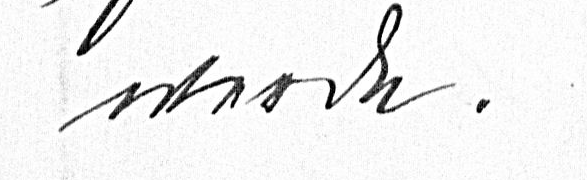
werde.
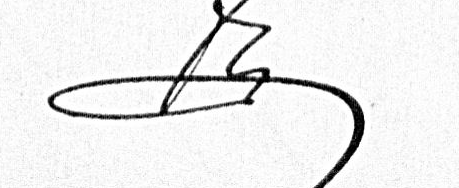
xx
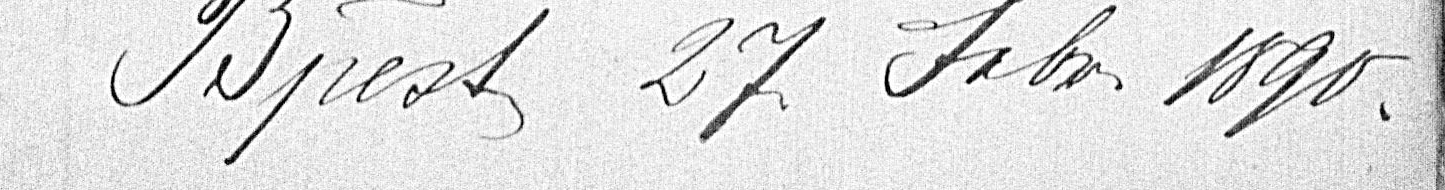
Bpest 27. Febr. 1890.
